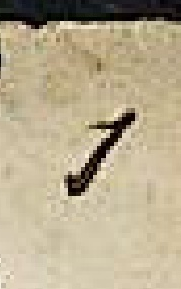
1
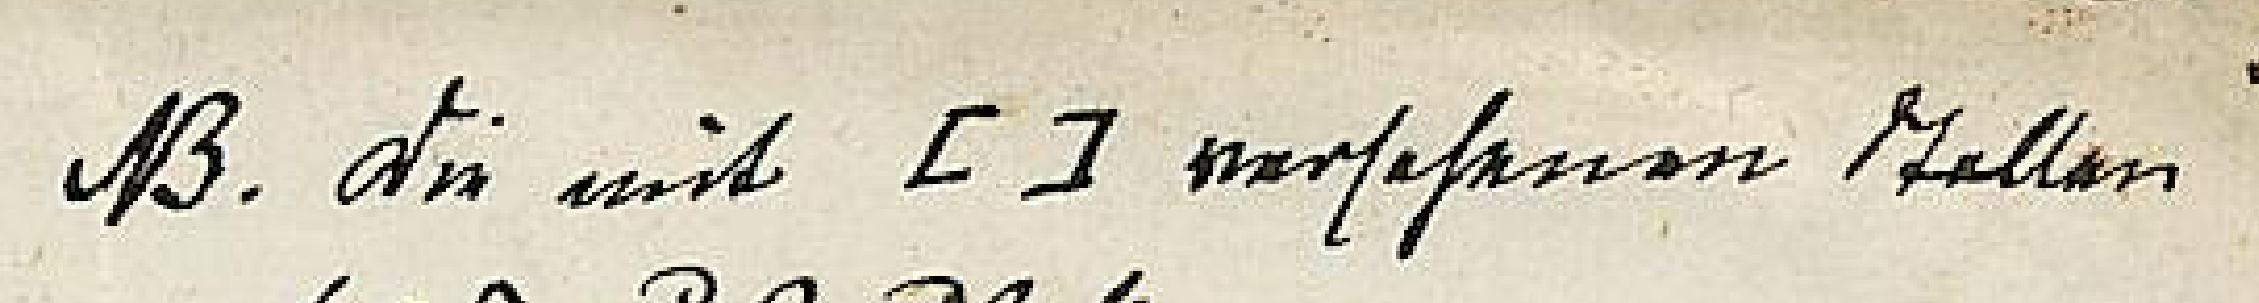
NB. Die mit [ ] versehenen Stellen
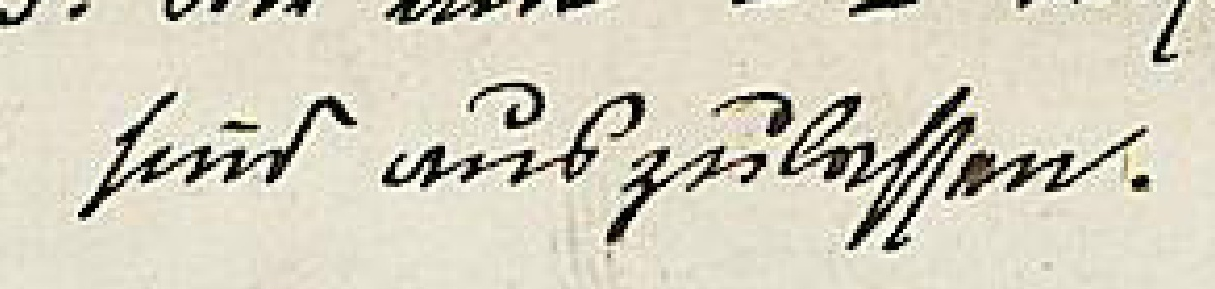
sind auszulassen.
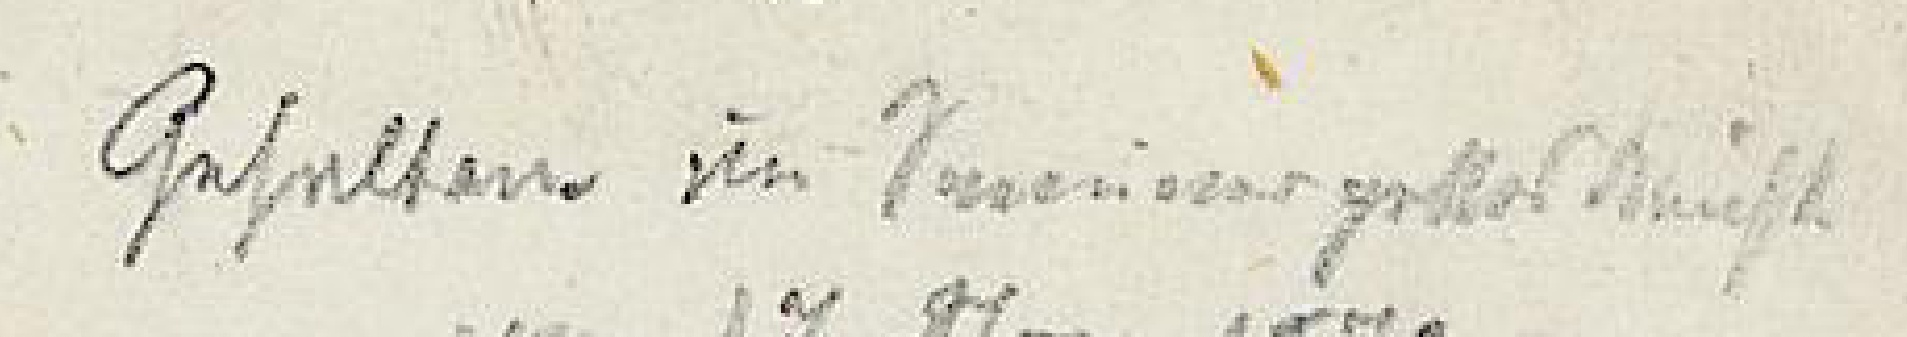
Gehalten im Seminargottesdienste
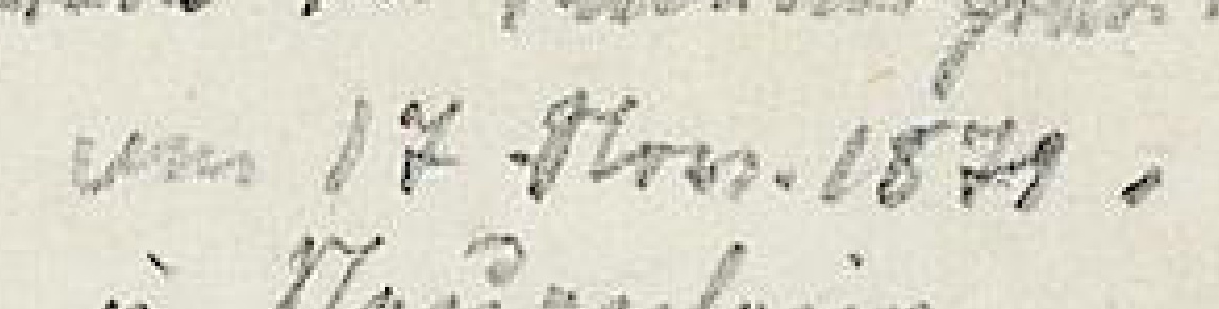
vom 17 Nov. 1871.
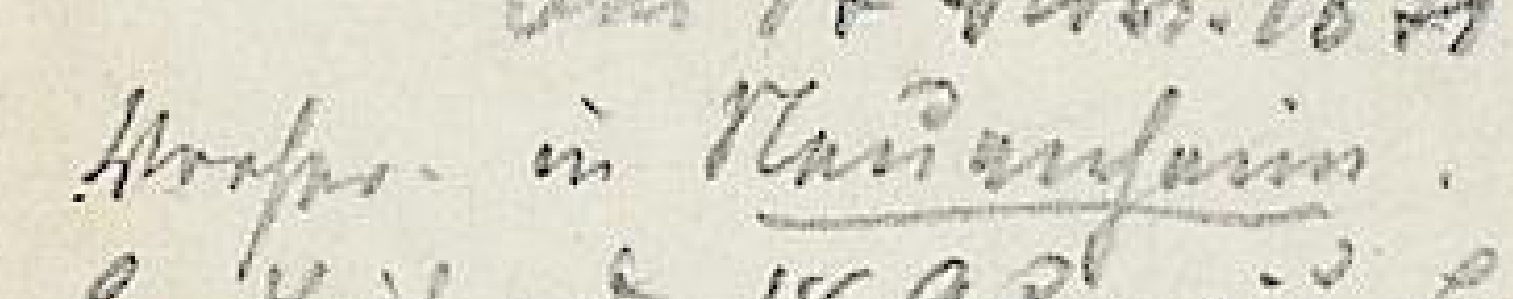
Vorher in Mannheim
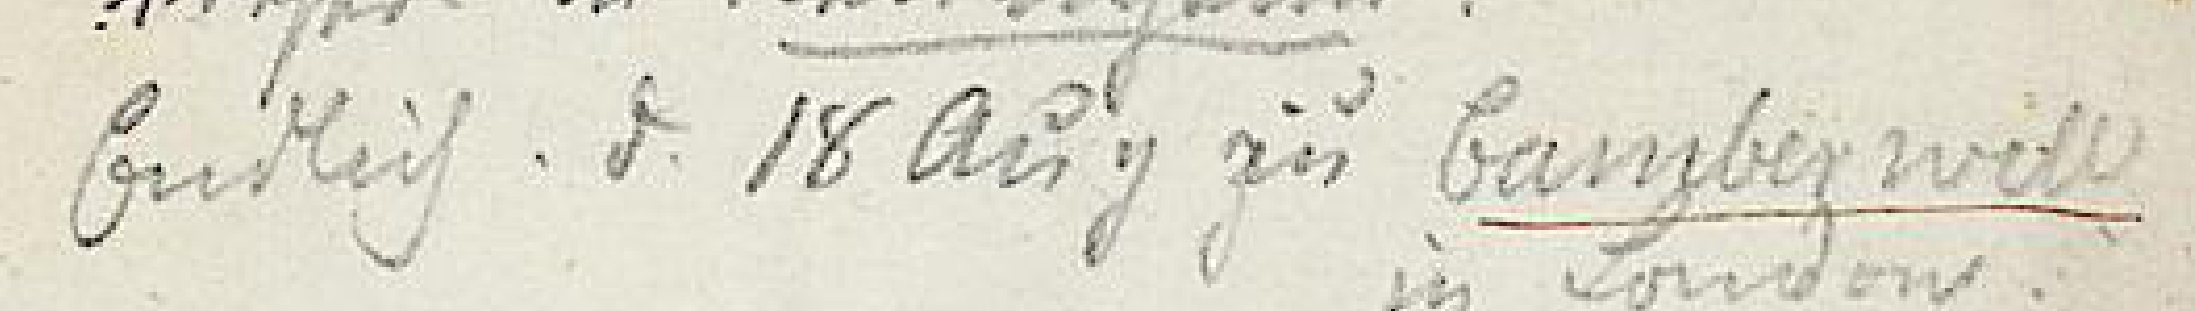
Endlich d. 18 Aug zu Camberwell
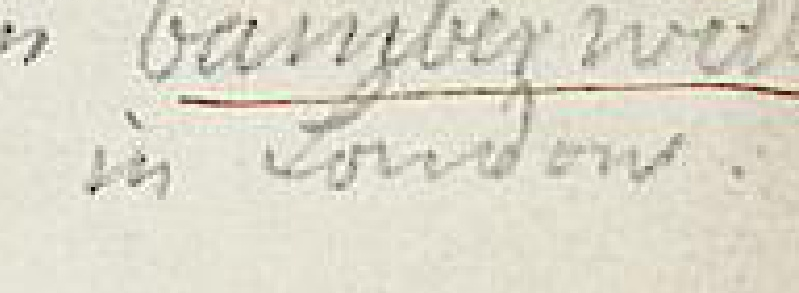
in London
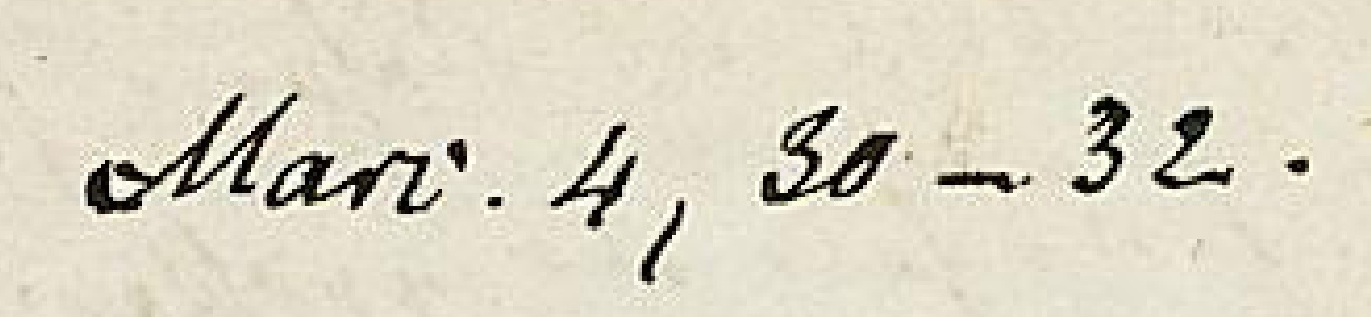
Marc. 4, 30 — 32.
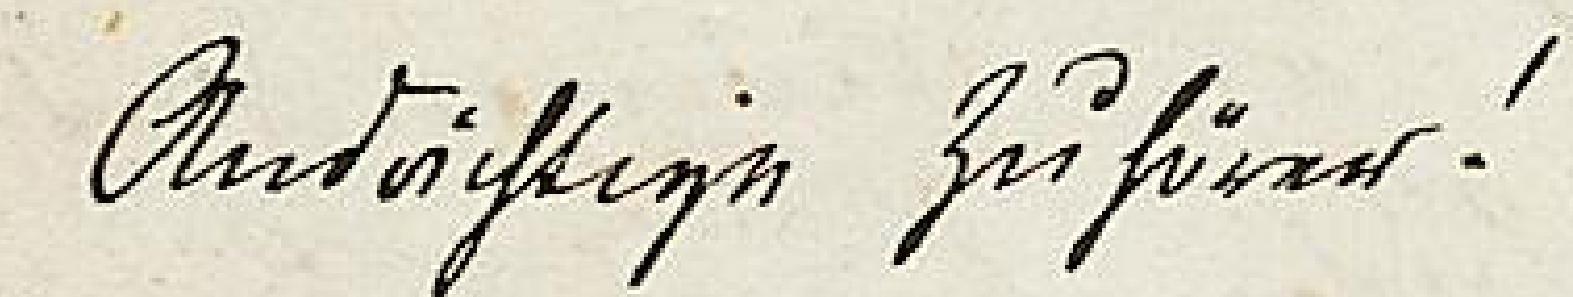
Andächtige Zuhörer!
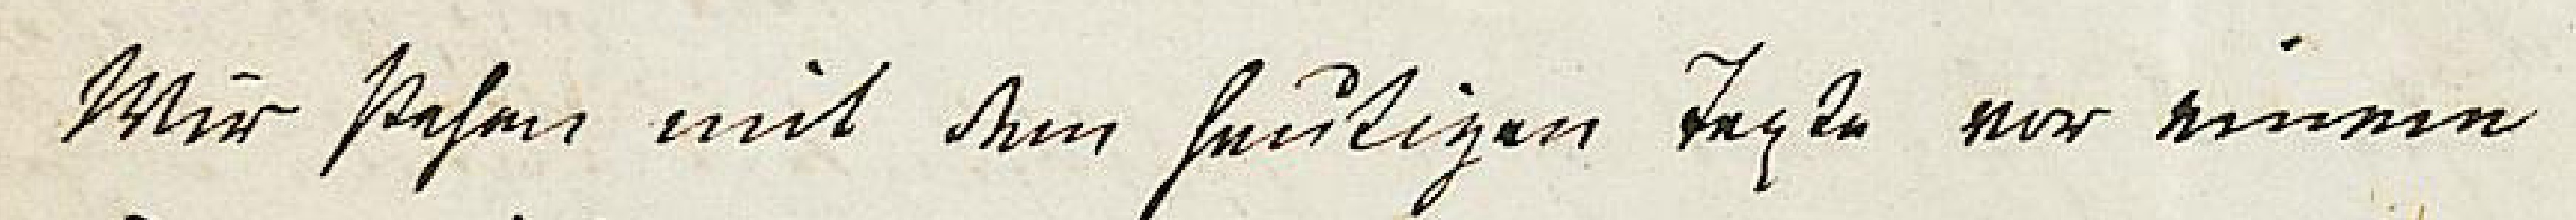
Wir stehen mit dem heutigen Texte vor einem
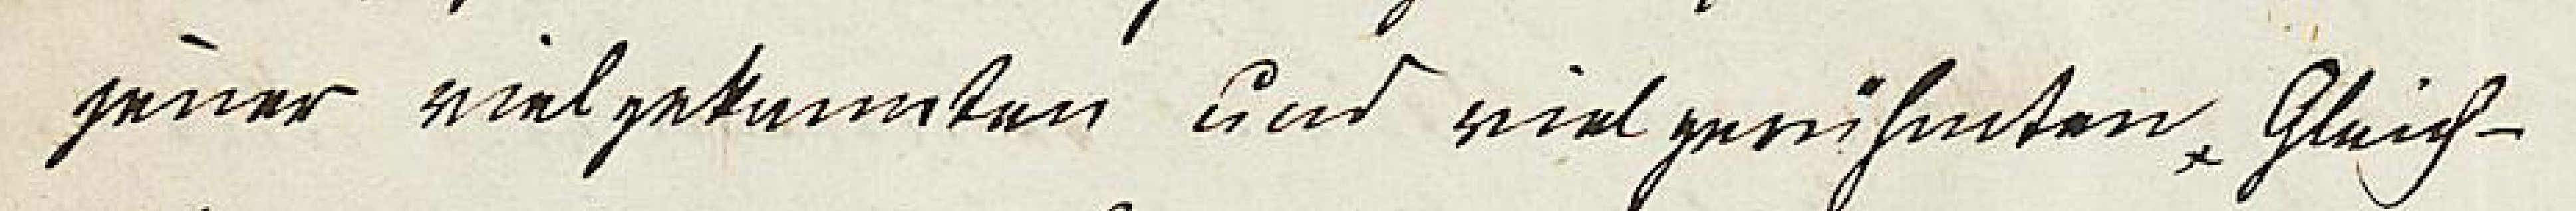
jener vielgekannten und vielgerühmten, Gleich¬
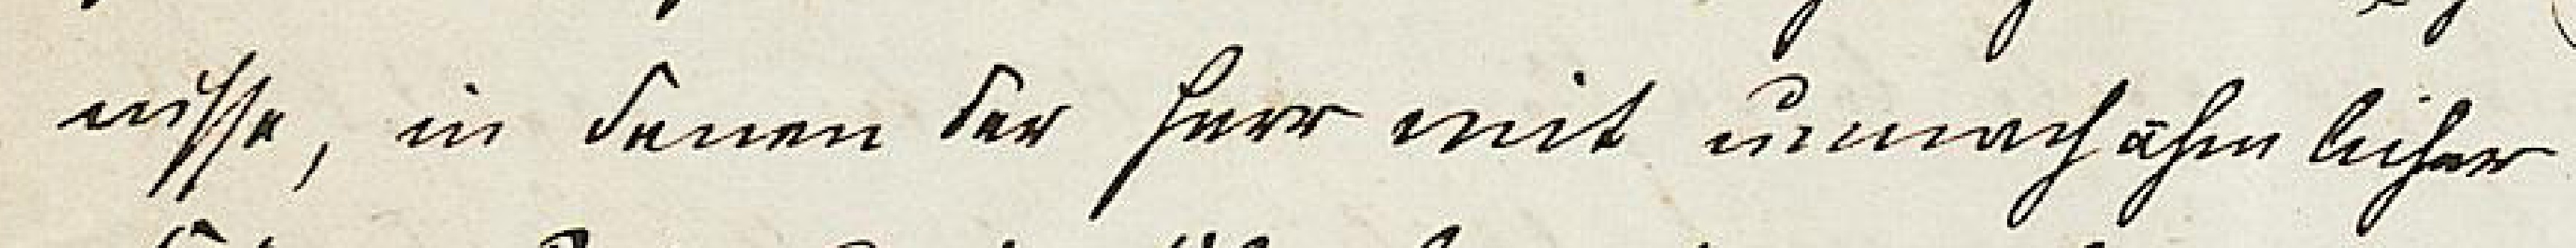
nisse, in denen der Herr mit unnachahmlicher
